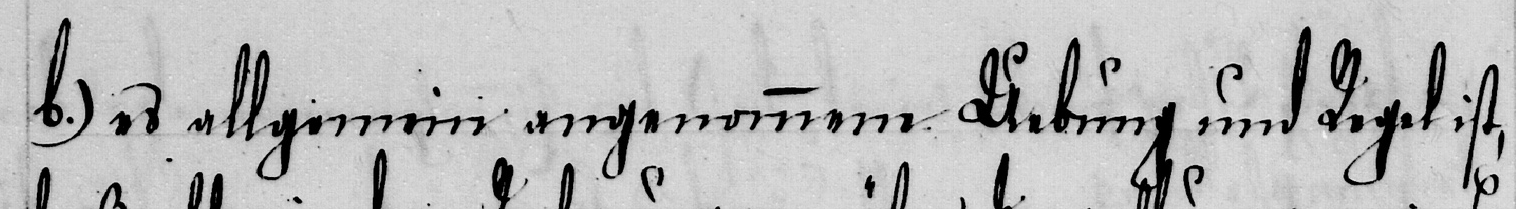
b.) es allgemein angenommene Uebung und Regel is¬
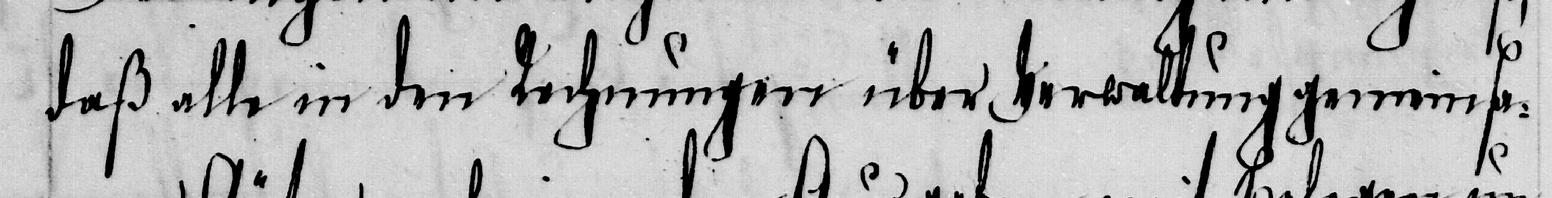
daß alle in den Rechnungen über Verwaltung gemeinsa¬
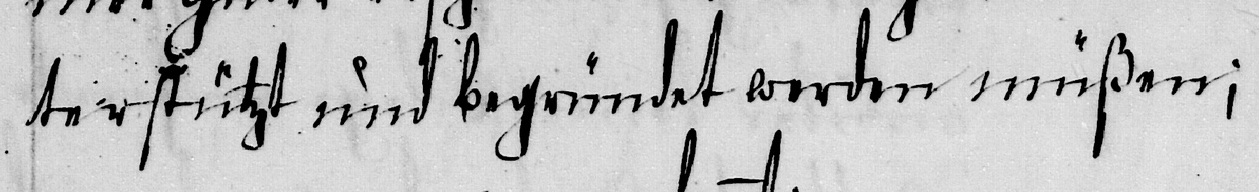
terstützt und begründet werden müßen;
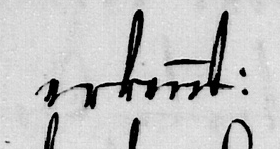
erkannt:
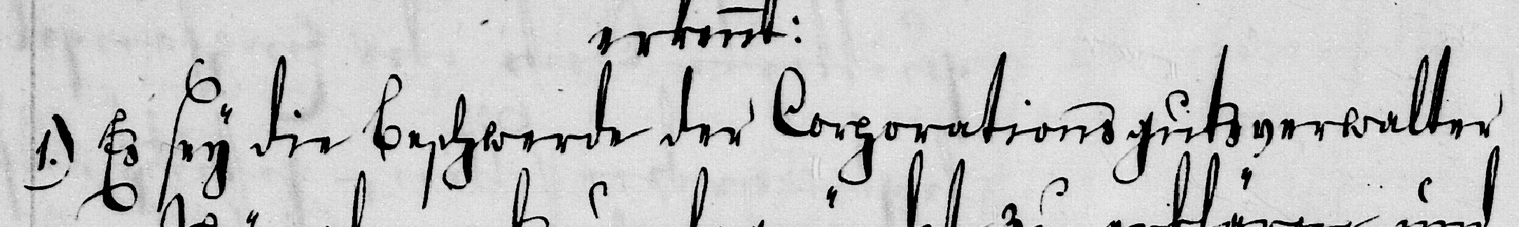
1.) Es sey die Beschwerde der Corporationsgutsverwalter
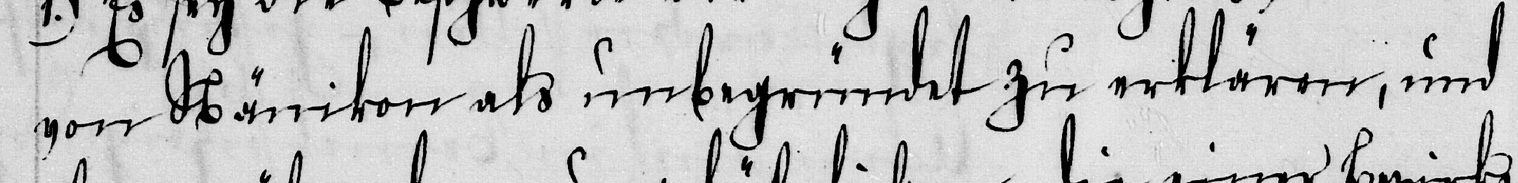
von Nänikon als unbegründet zu erklären, und
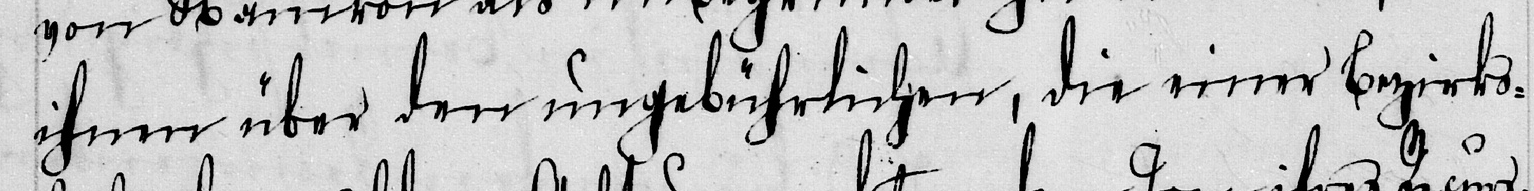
ihnen über den ungebührlichen, die einer Bezirks¬
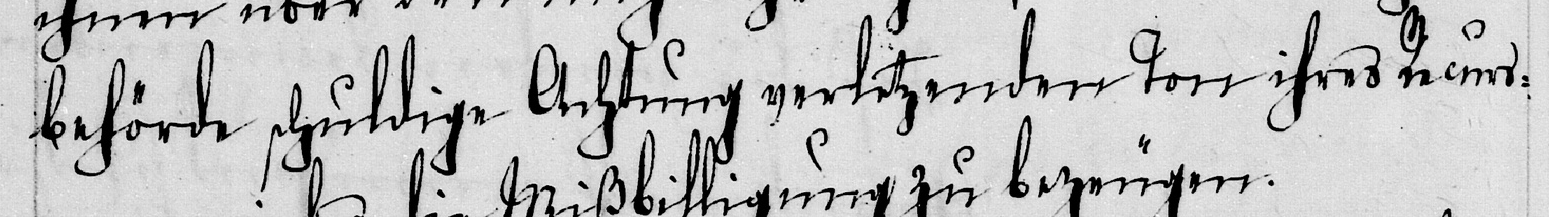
behörde schuldige Achtung verletzenden Ton ihres Recurs¬
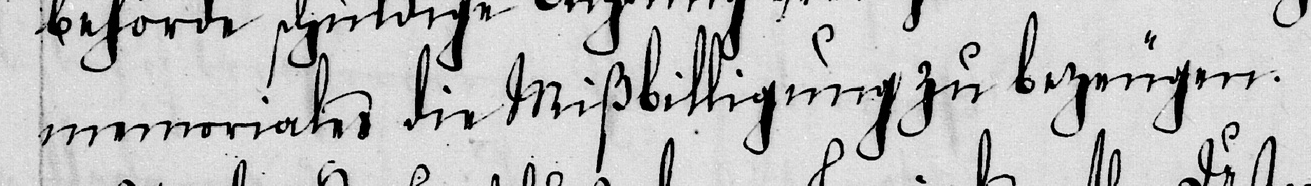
memoriales die Mißbilligung zu bezeugen.
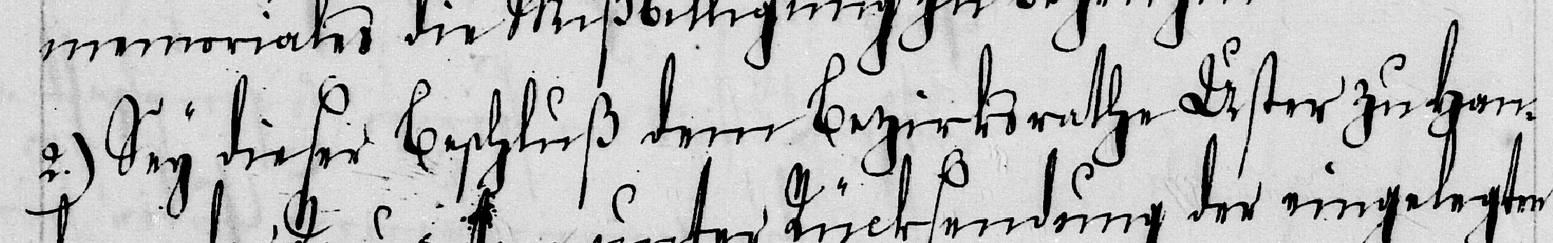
2.) Sey dieser Beschluß dem Bezirksrathe Uster zu Han¬
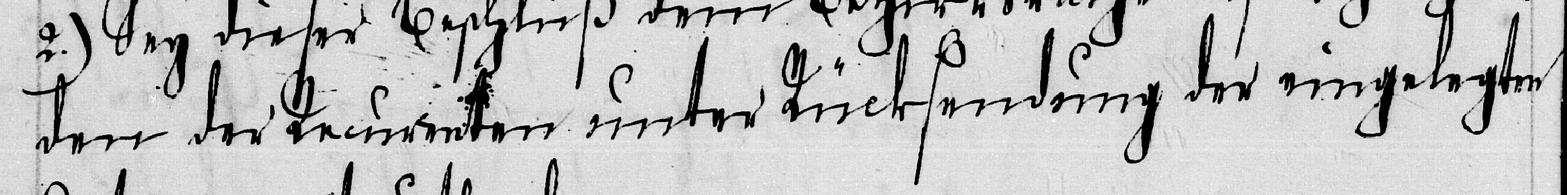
den der Recurenten unter Rücksendeung der eingelegten
